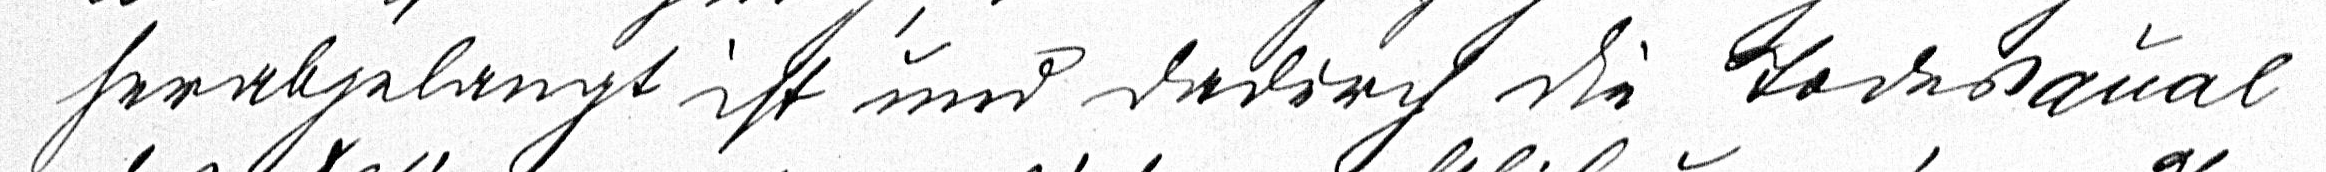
herabgelangt ist und dadurch die Todesqual
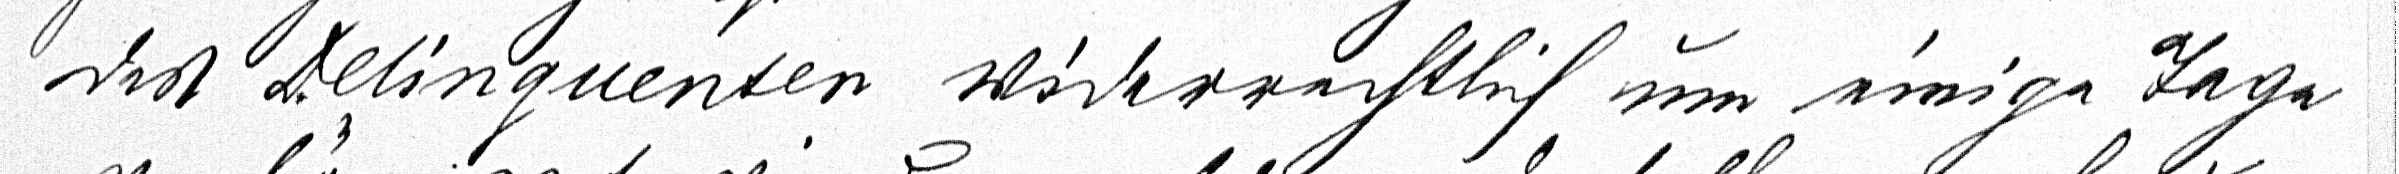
des Delinquenten widerrechtlich um einige Tage
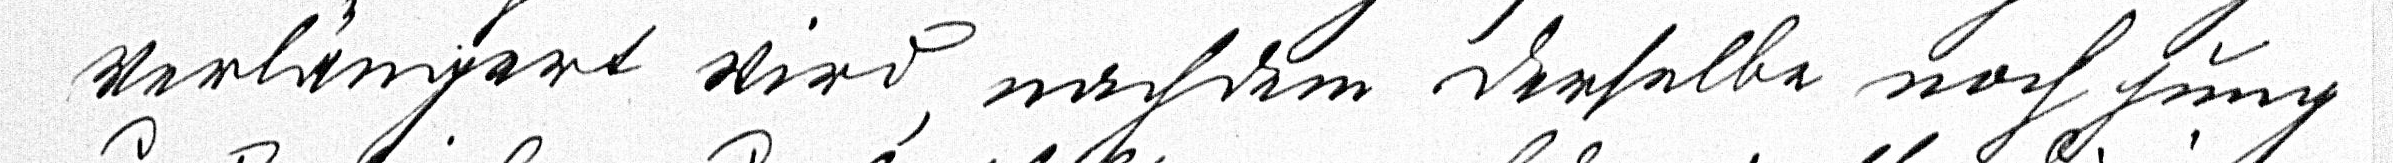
verlängert wird, nach dem derselbe noch jung
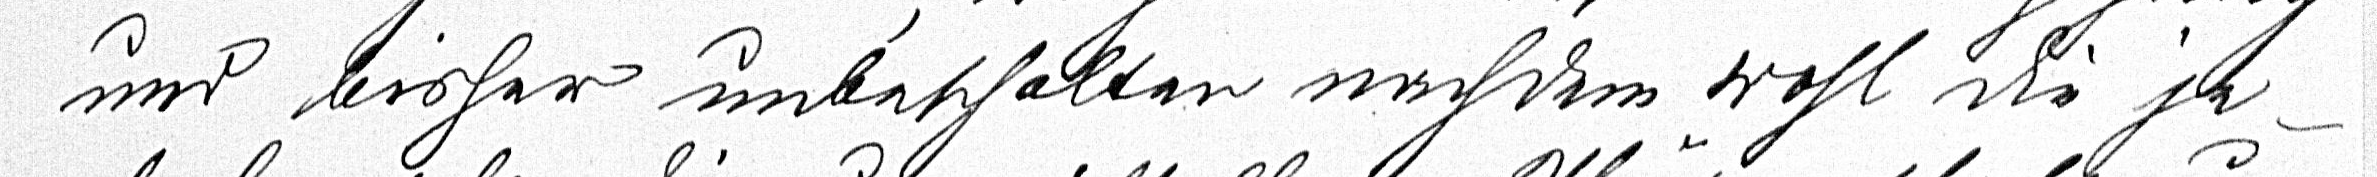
und bisher unbescholten nachdem wohl die je¬
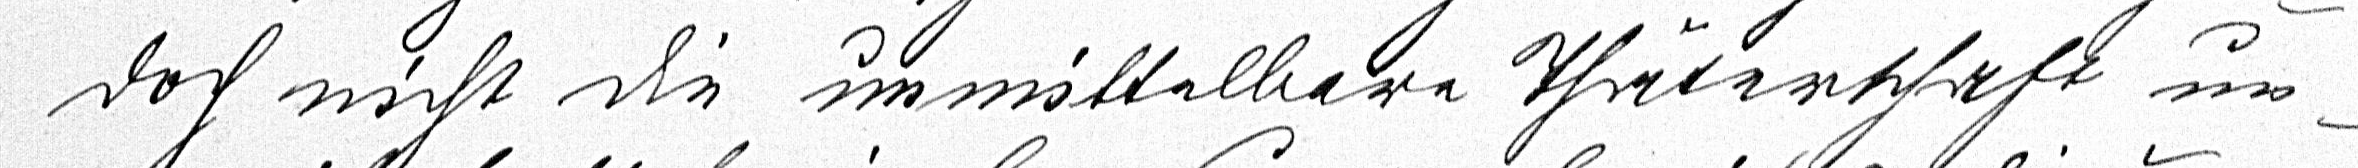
doch nicht die unmittelbare Thäterschaft un¬
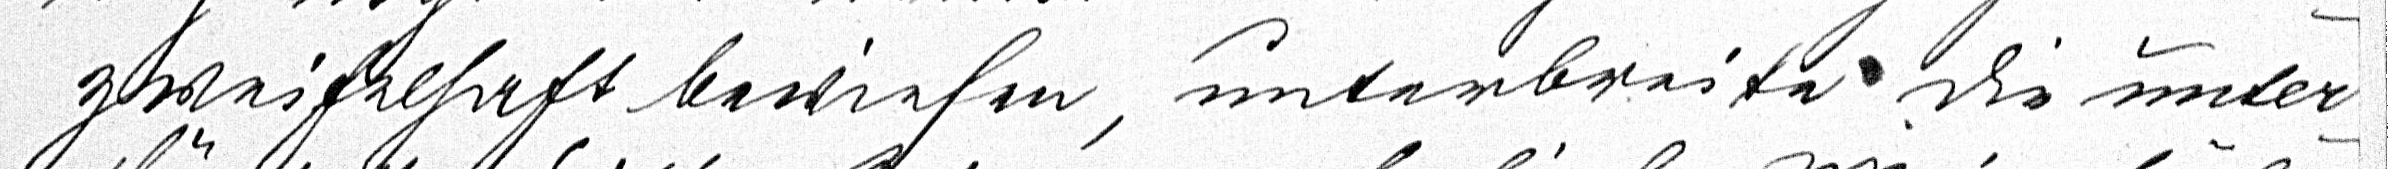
zweifelhaft bewiesen, unterbreite die unter
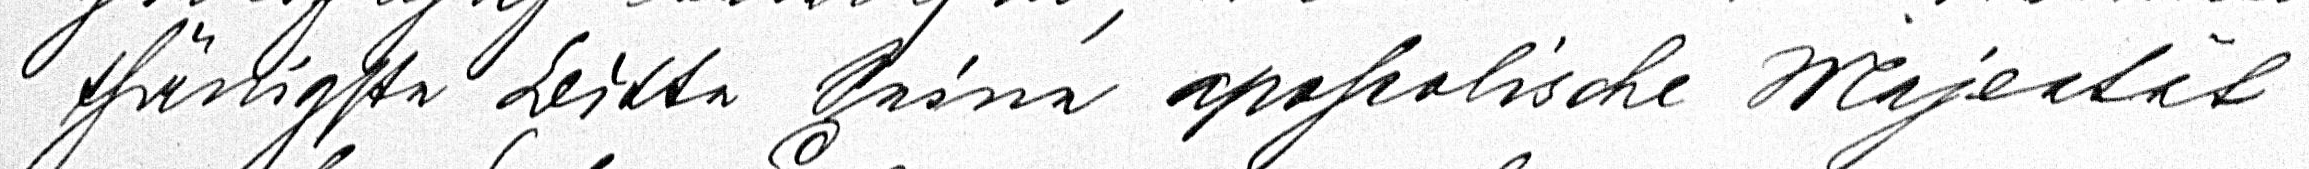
thänigste Bitte Seine apostolische Majestät¬
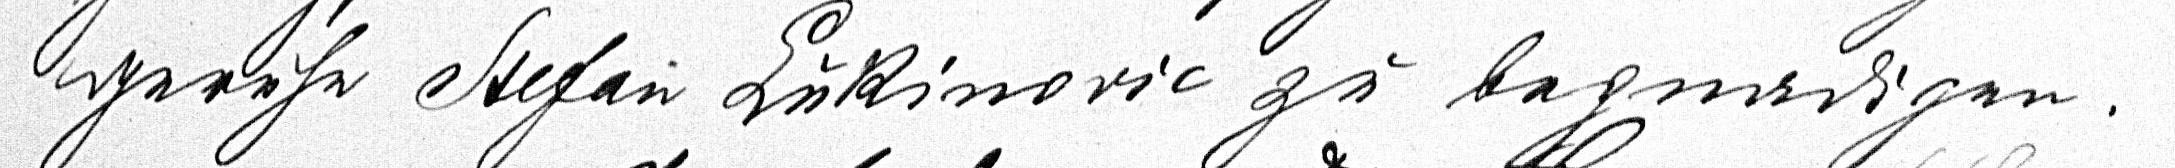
geruhe Stefan Lukinovic zu begnadigen.
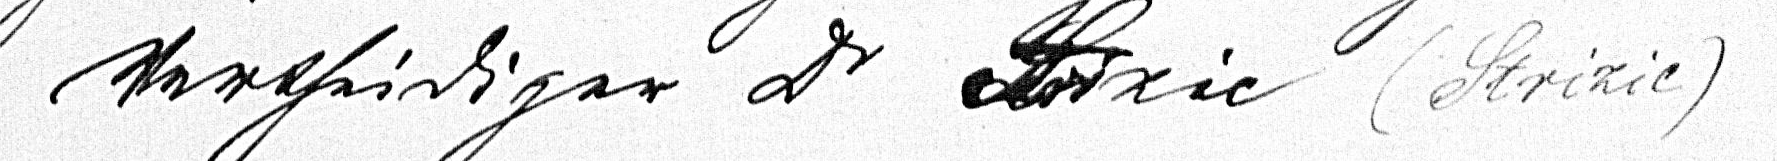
Vertheidiger Dr Strizic (Strizic)
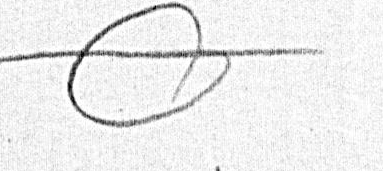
Xx
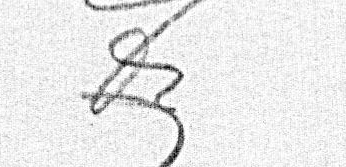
Xx
